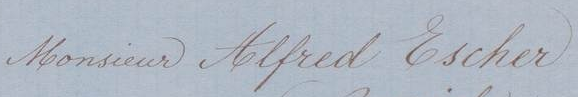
Monsieur Alfred Escher
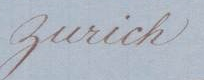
Zurich
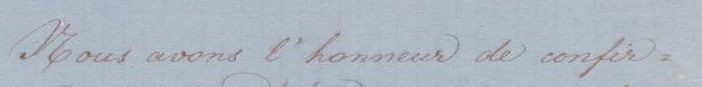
Nous avons l'honneur de confir-
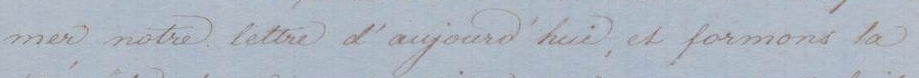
mer notre lettre d'aujourd'hui, et formons la
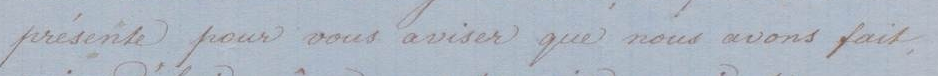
présente pour vous aviser que nous avons fait,
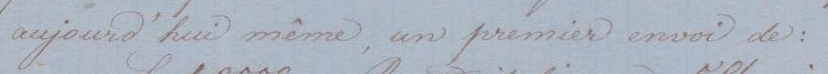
aujourd'hui même, un premier envoi de:
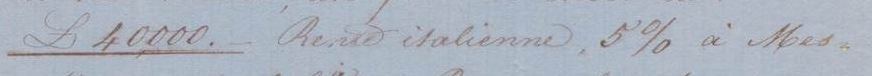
₤ 40,000. Rente italienne, 5% à Mes-
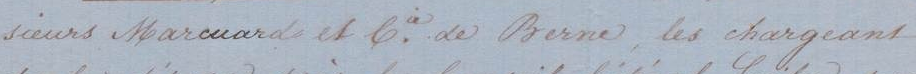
sieurs Marcuard et Cie de Berne, les chargeant
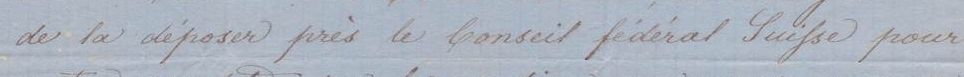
de la déposer près le Conseil fédéral Suisse pour
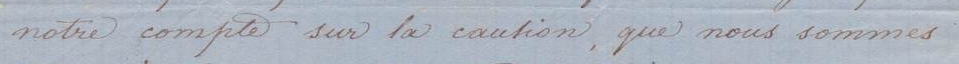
notre compte sur la caution, que nous sommes
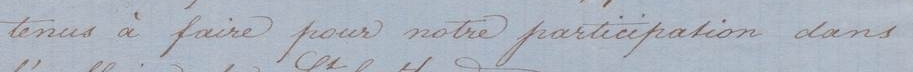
tenus à faire pour notre participation dans
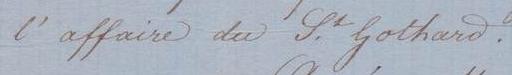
l'affaire du St Gothard.
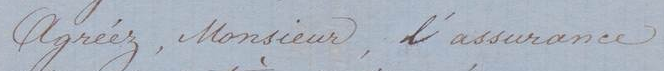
Agréez, Monsieur, l'assurance
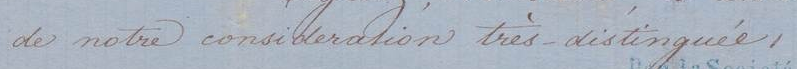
de notre consideration très–distinguée,
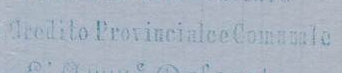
Credito Provinciale e Comunale
